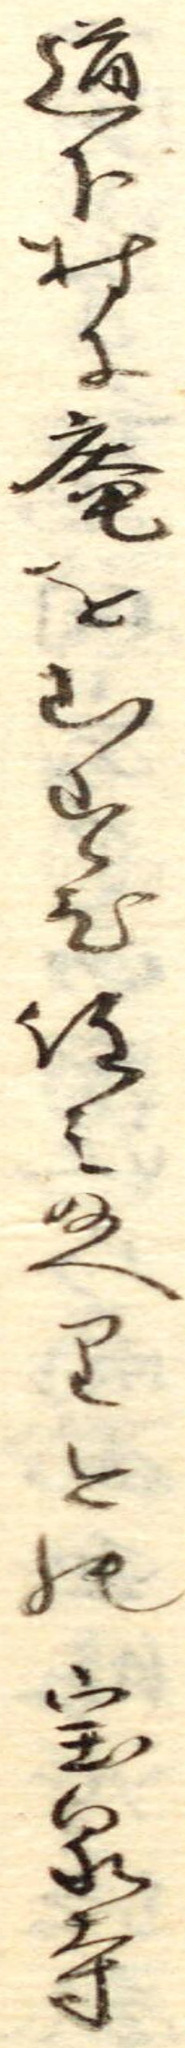道下村に庵をむすひ住み給へりとの宝泉寺
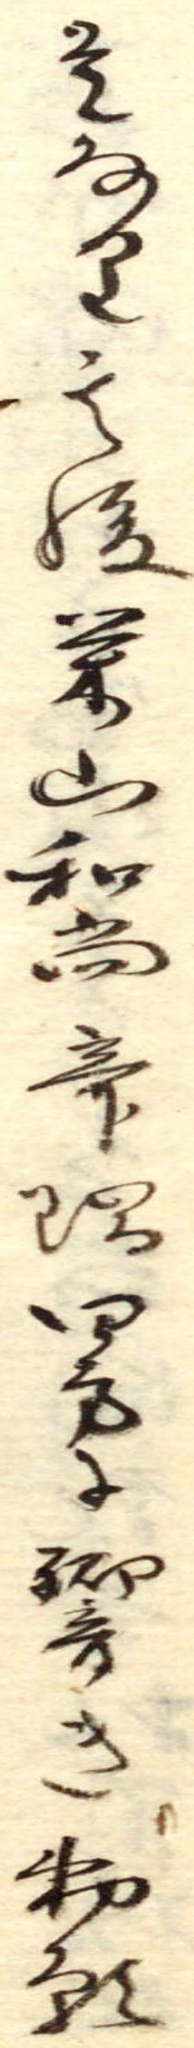是なり其後栄山和尚奇瑞四方に響き勅願
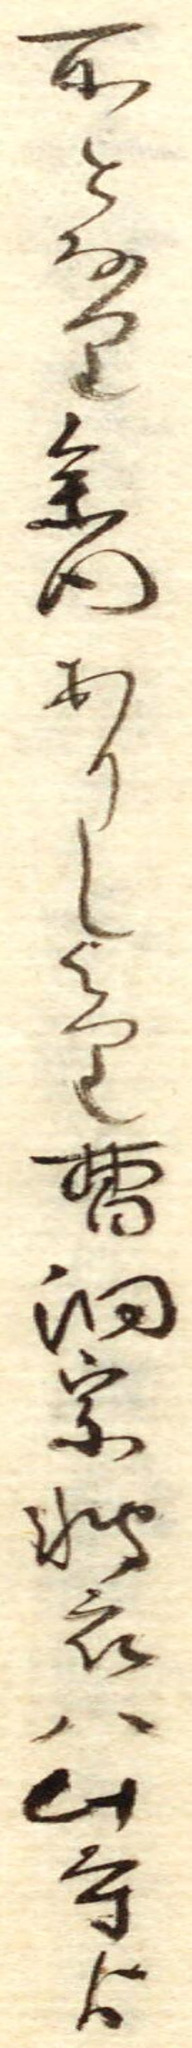所となり参内ありしより曹洞宗転衣は此寺ゟ
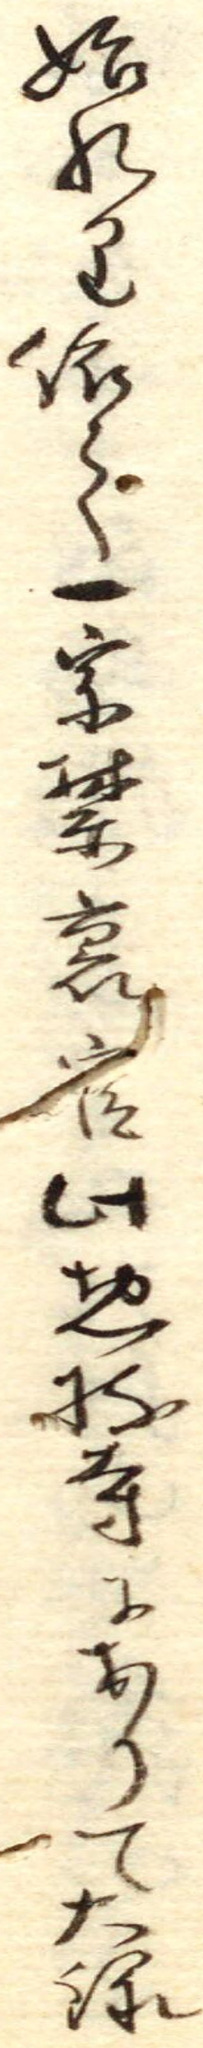始れり依て一宗禁裏官此惣持寺にありて大録
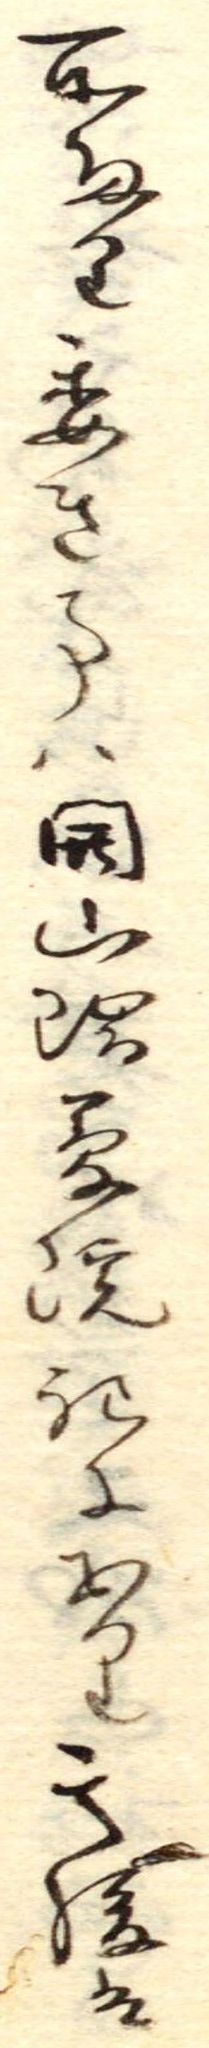所たり委き事は開山瑞菅院記にあり其後は
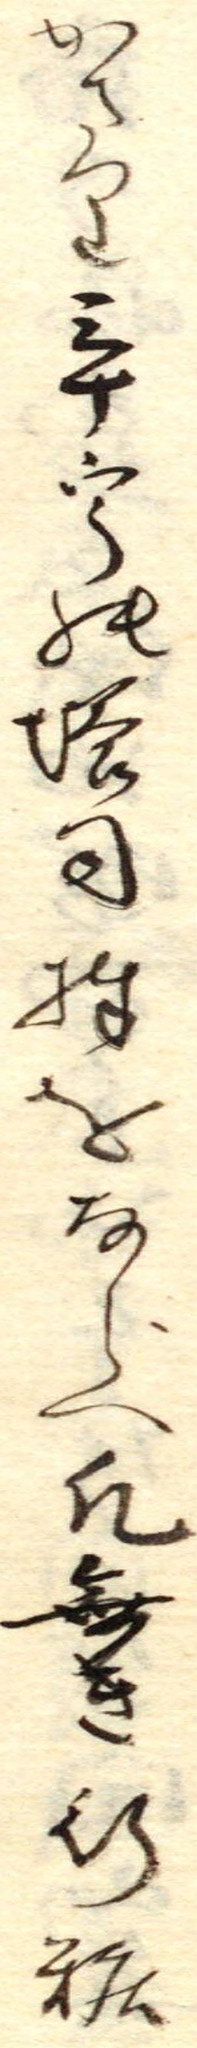かさり三十宇の塔司棟をならへ凡無き行粧
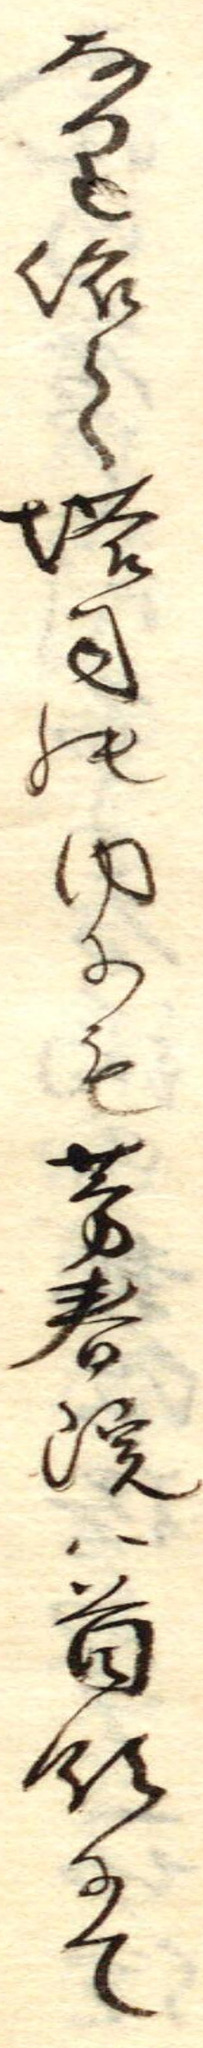なり依て塔司の内にも芳春院は首領にて
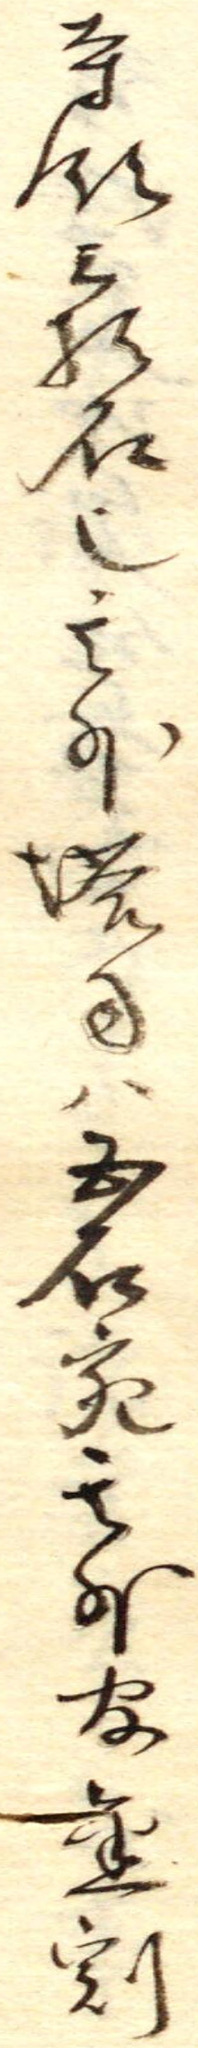寺領三拾石也其外塔司は五石宛其外官金割

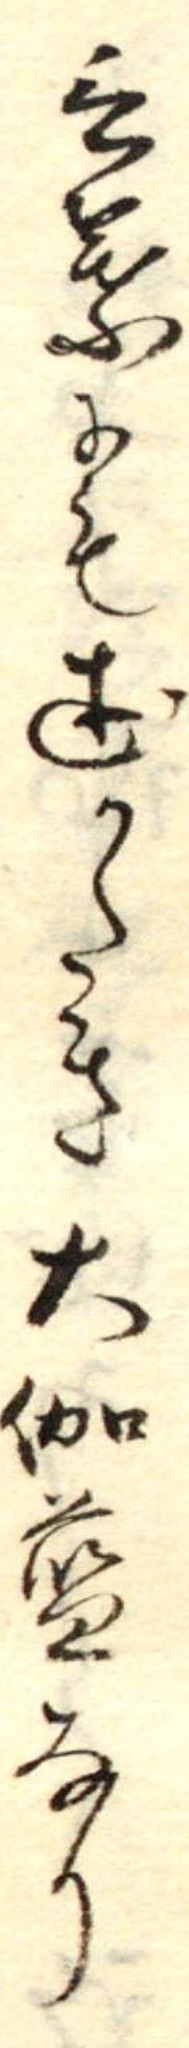言葉にも述かたき大伽藍なり
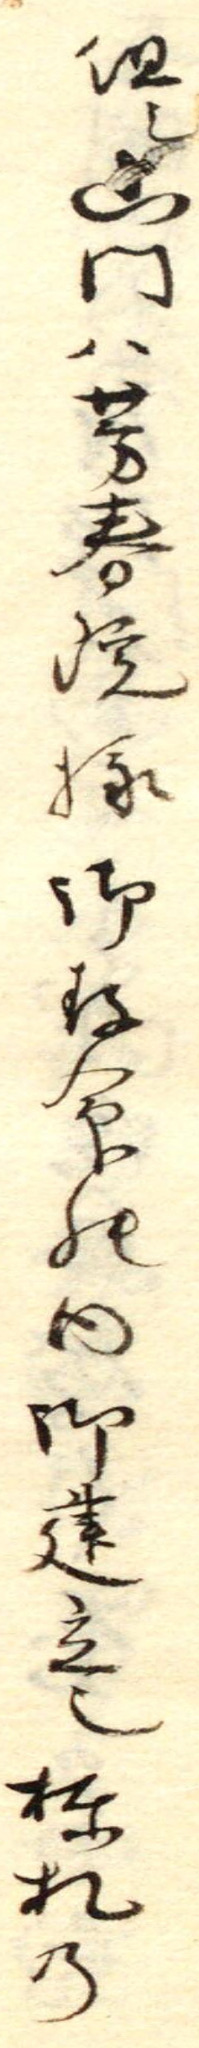但し山門は芳春院様御存命の内御建立也棟札の
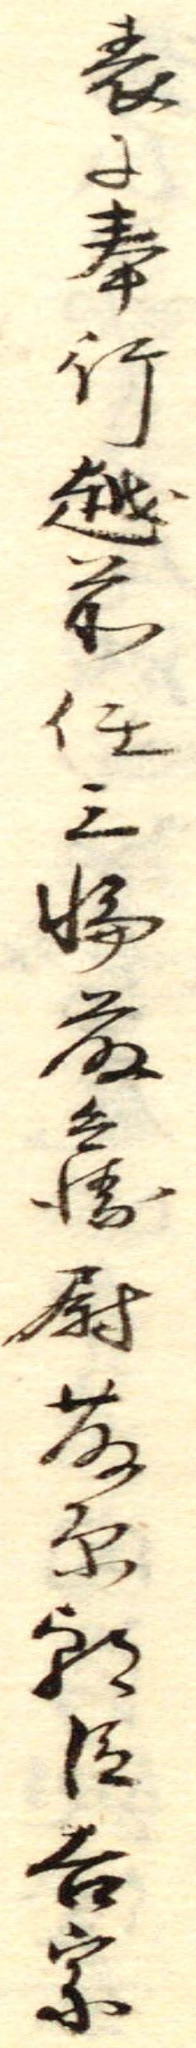表に奉行越前任三輪藤兵衛尉藤原朝臣吉宗
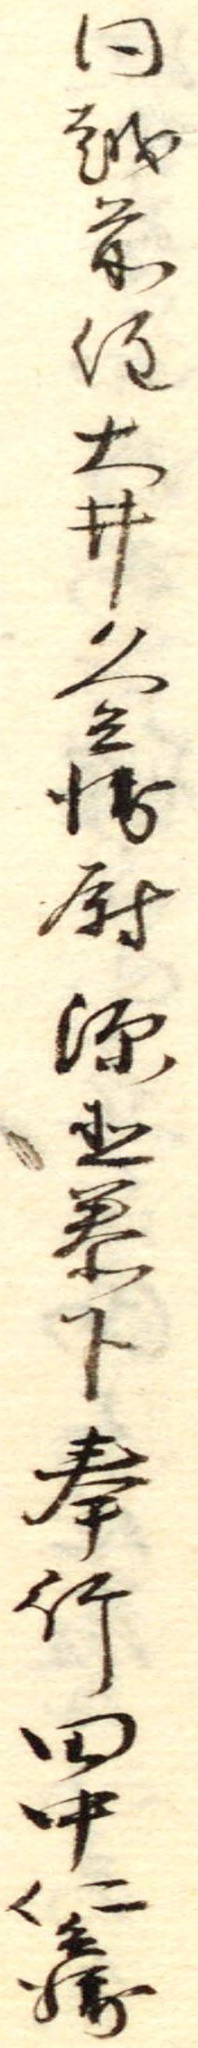同越前任大井九兵衛尉源直泰下奉行田中仁兵衛
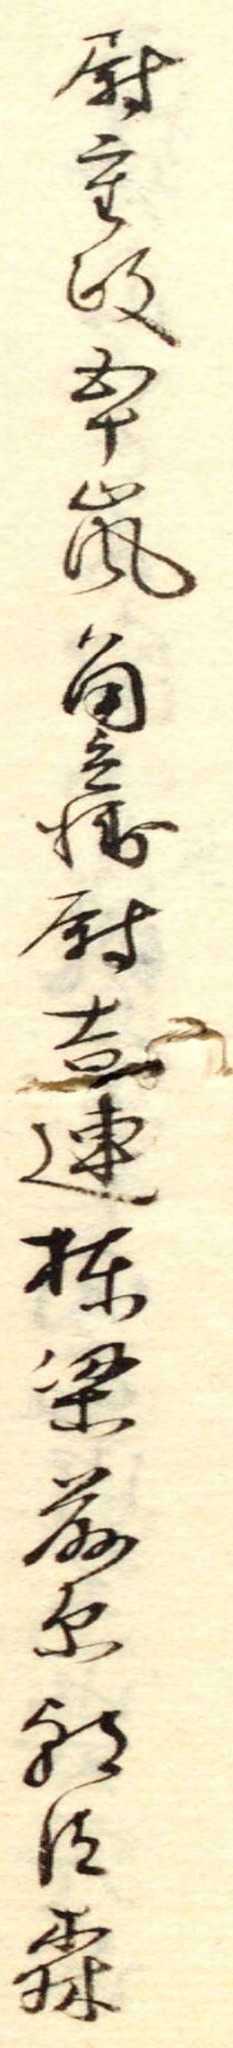尉重政五十嵐角兵衛尉吉連棟梁藤原朝臣森
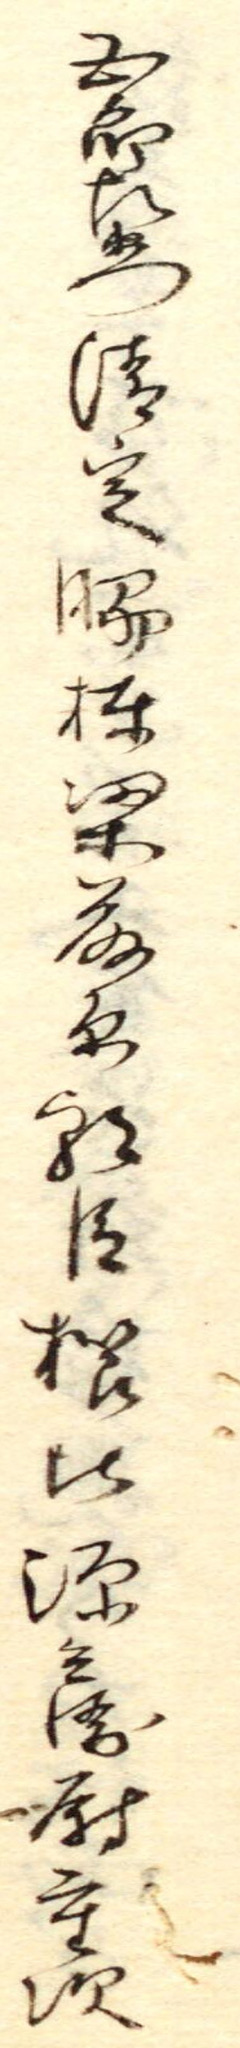五郎左衛門清定脇棟梁藤原朝臣櫛比源兵衛尉重次
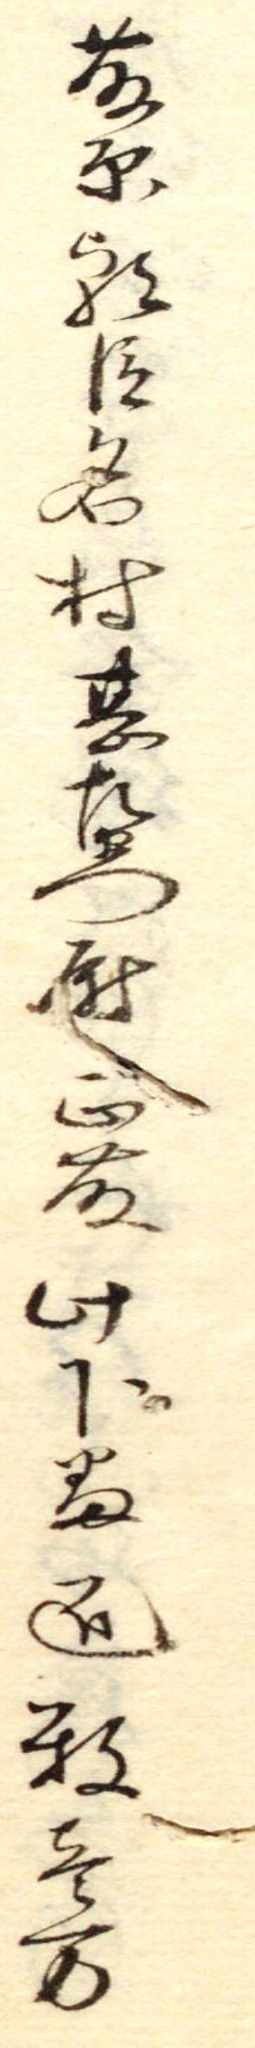藤原朝臣名村甚左衛門尉正藤此下番匠数壱万
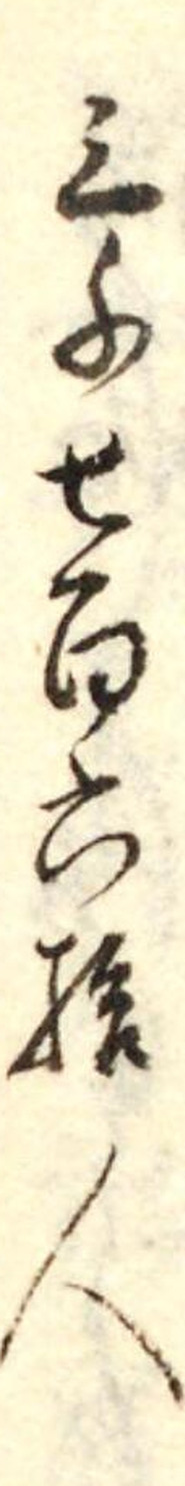三千七百六拾人
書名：能登名跡誌
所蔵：Ishikawa Prefectural Library
